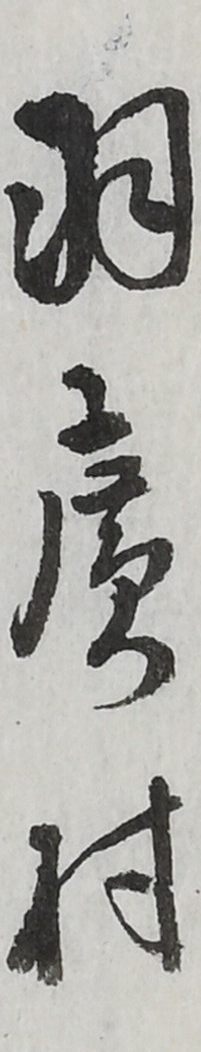羽広村
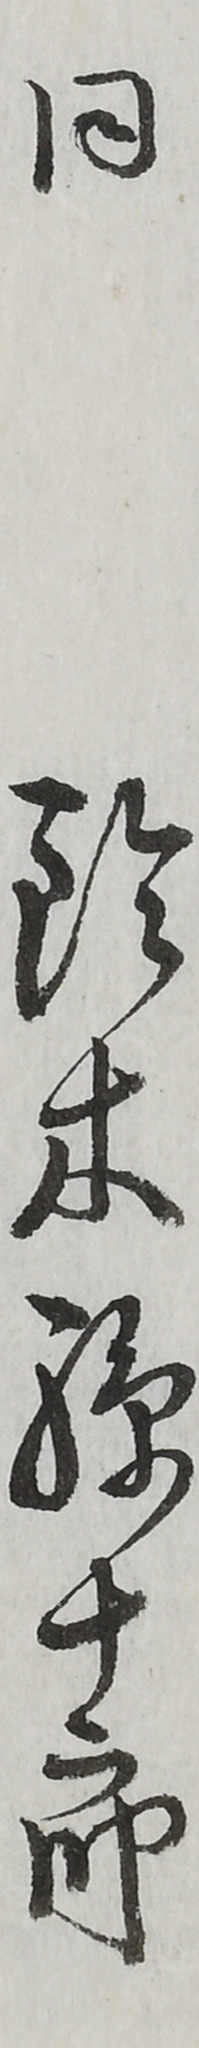同鈴木孫十郎
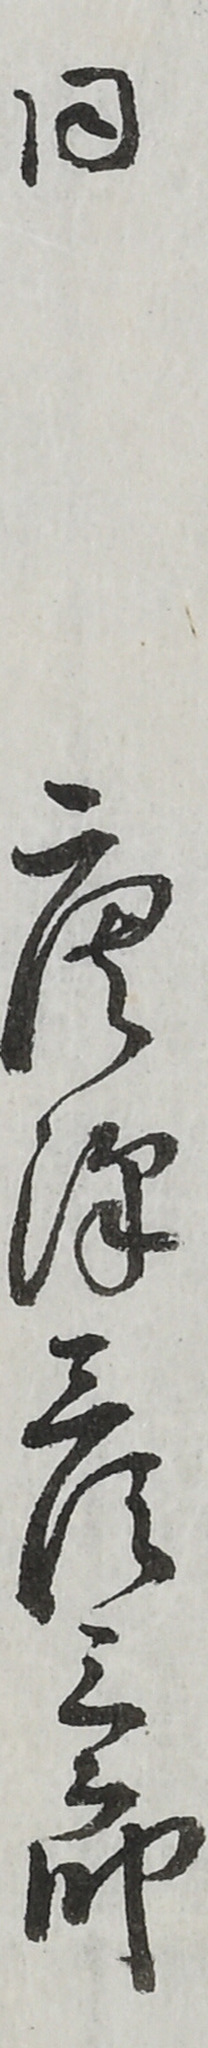同唐澤彦三郎
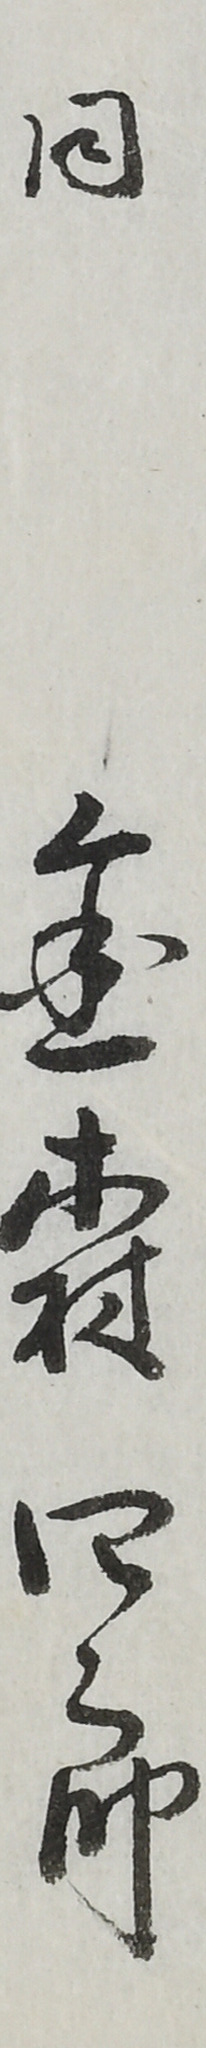同金森四郎
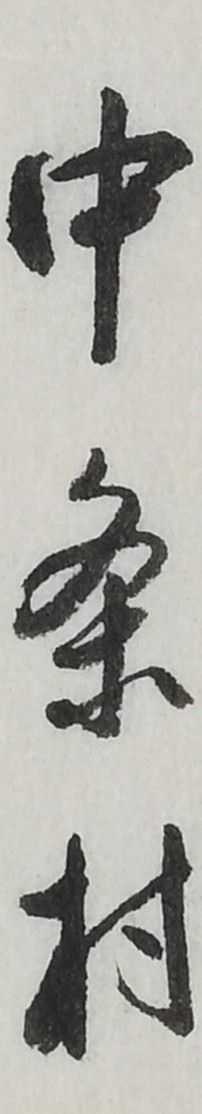中条村

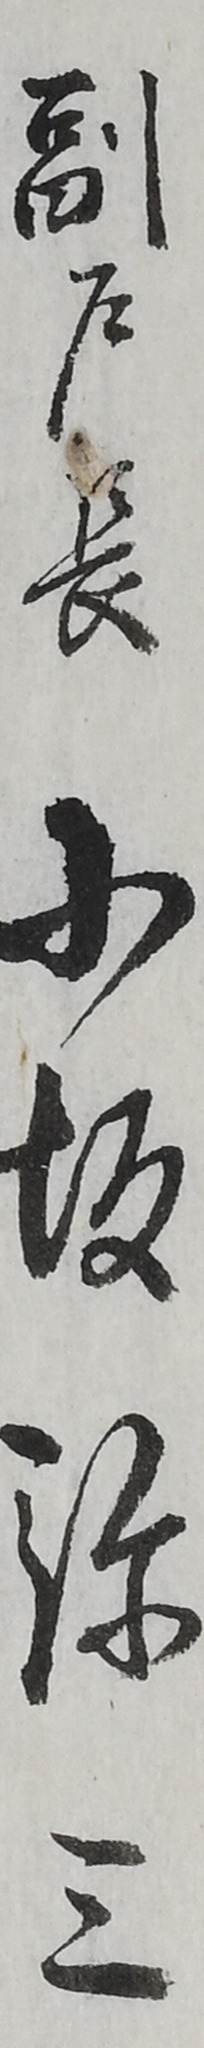福戸長小坂弥三
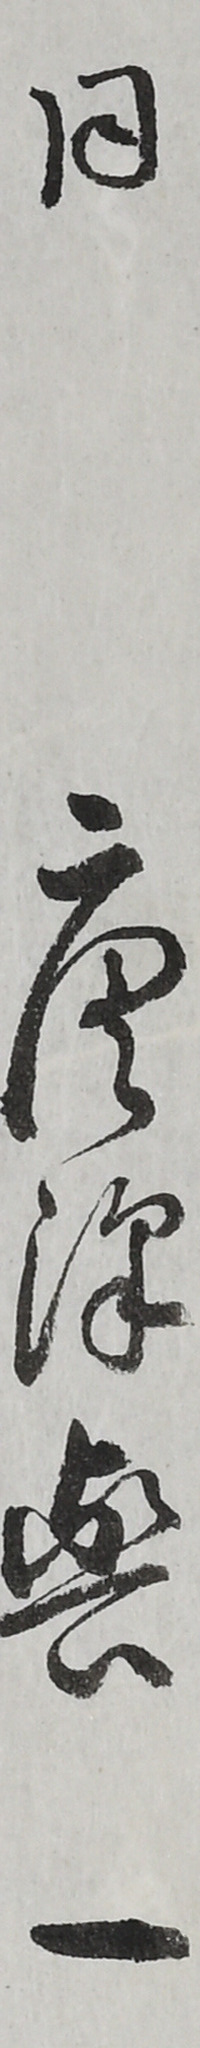同唐澤与一
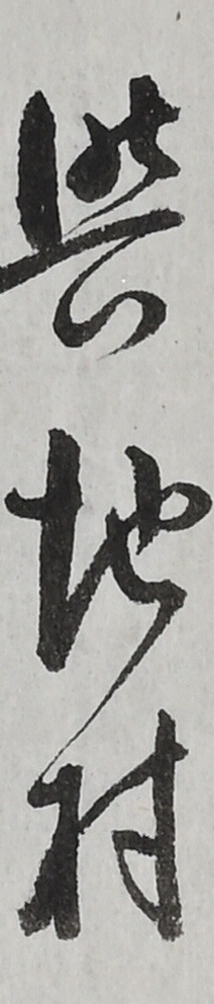与地村
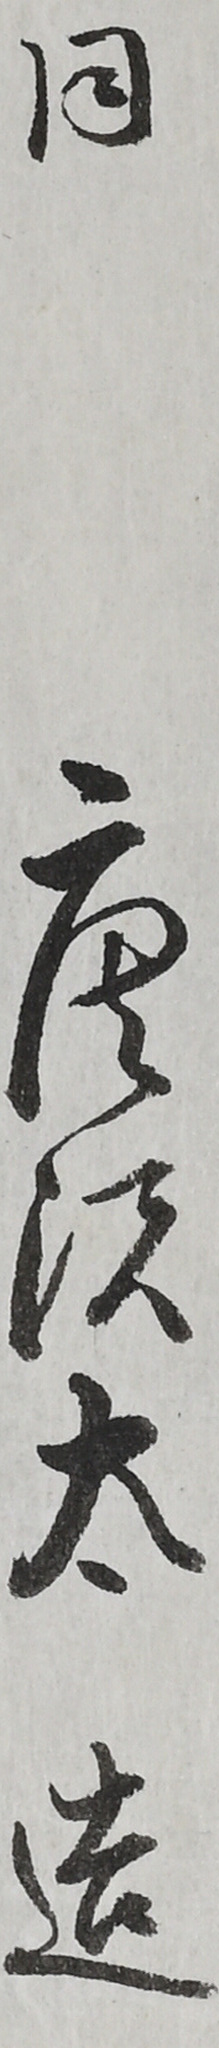同唐沢太造
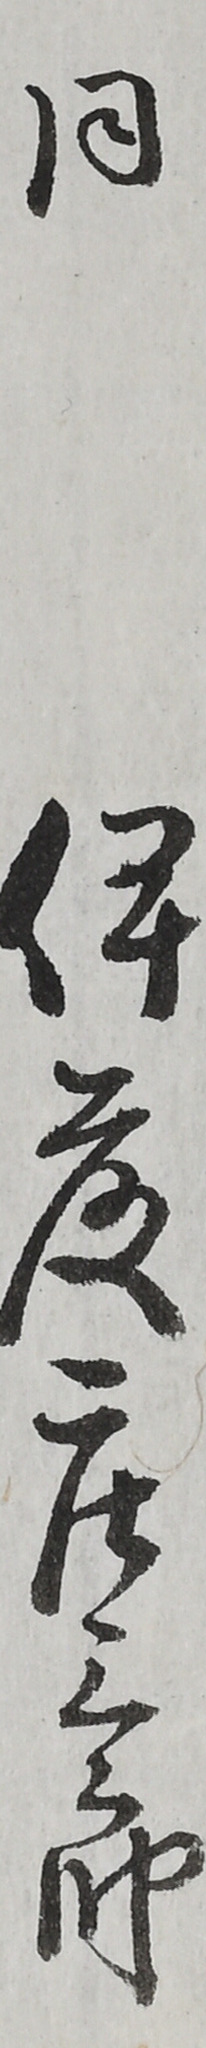同伊藤庄三郎
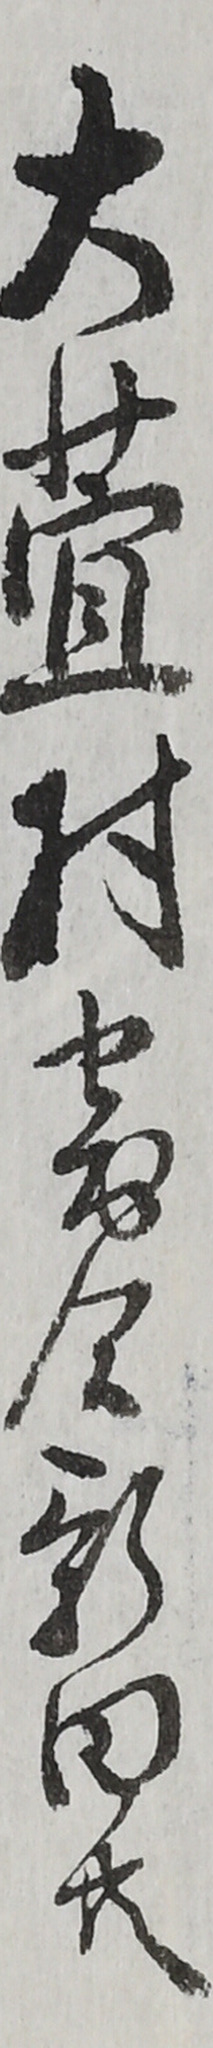大萱村寄合新田共
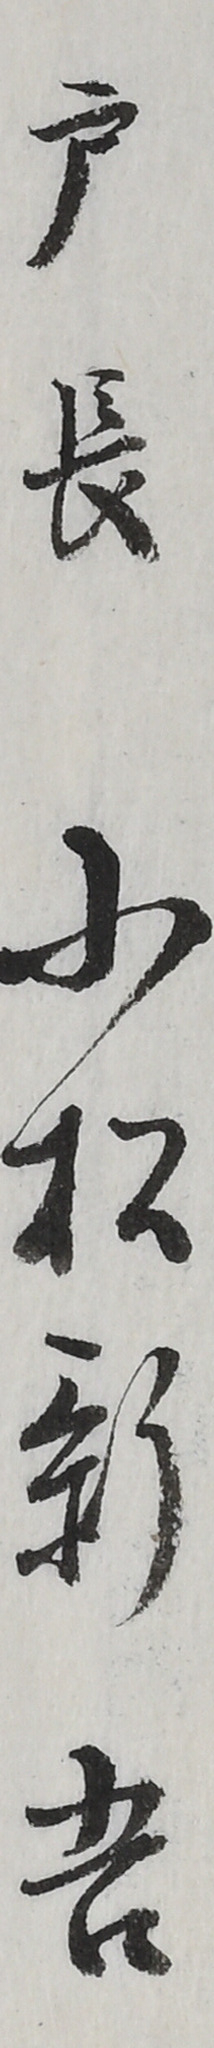戸長小松新吾
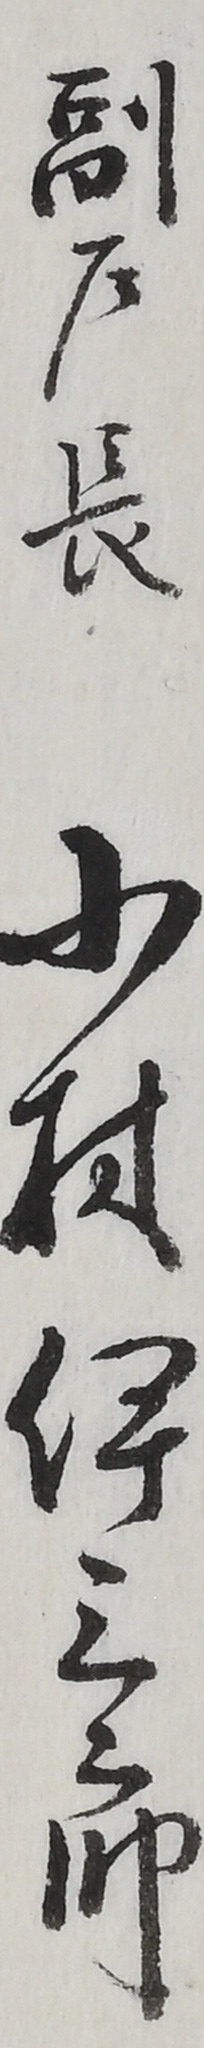副戸長小林伊三郎
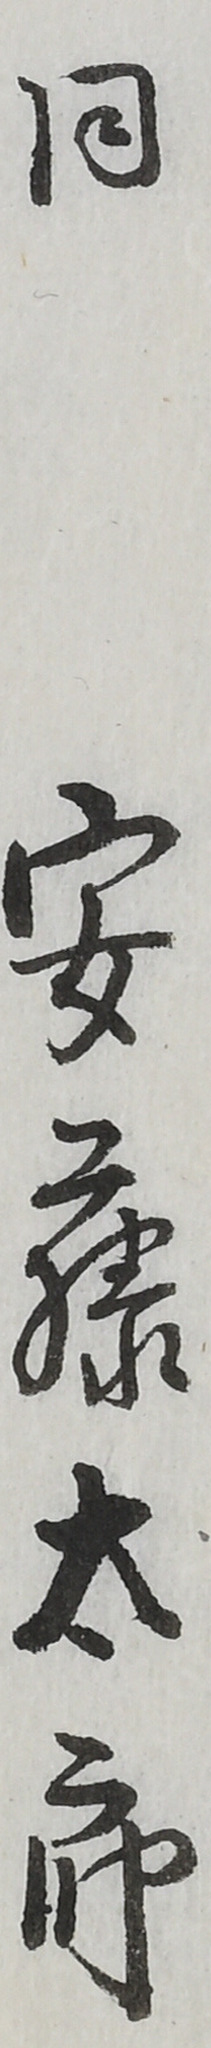同安藤太郎
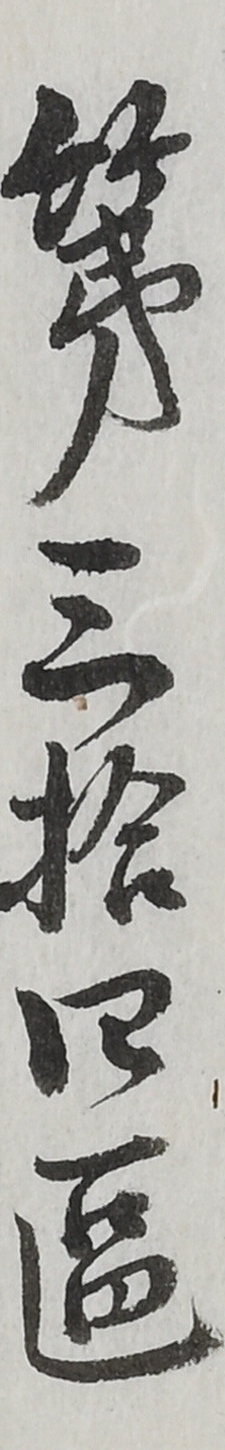第三拾四区
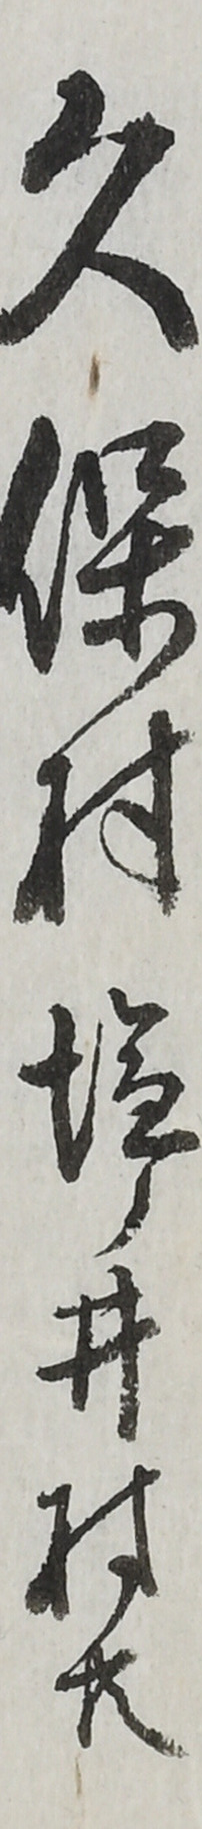久保村塩ノ井村共
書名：伊那郡毎村戸長副戸長名簿
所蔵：伊那市立高遠町図書館・合同会社AMANE
